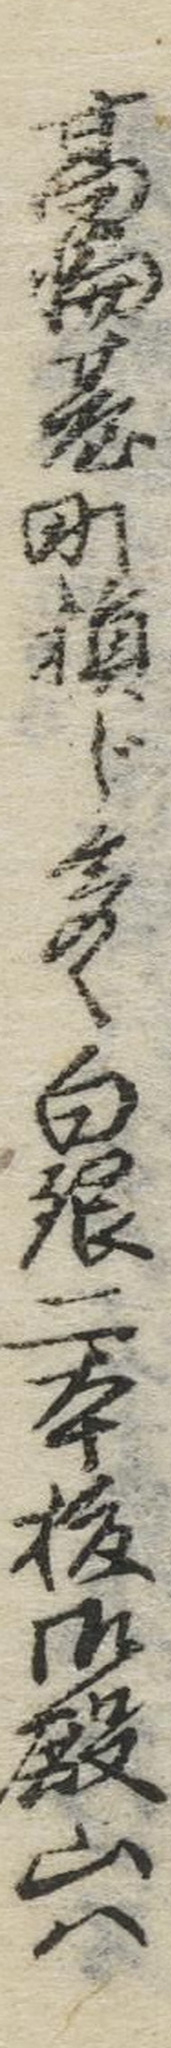高輪台町損じ多く白銀二本榎御殿山ハ
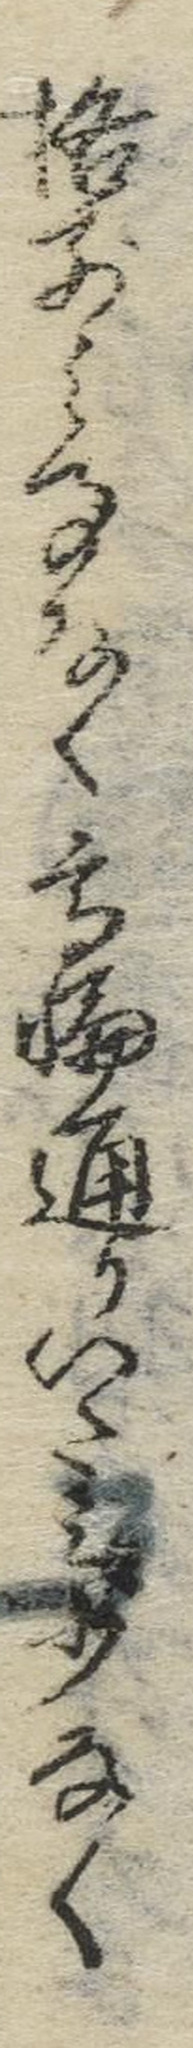格別之事なく高輪通りいたミ少なく
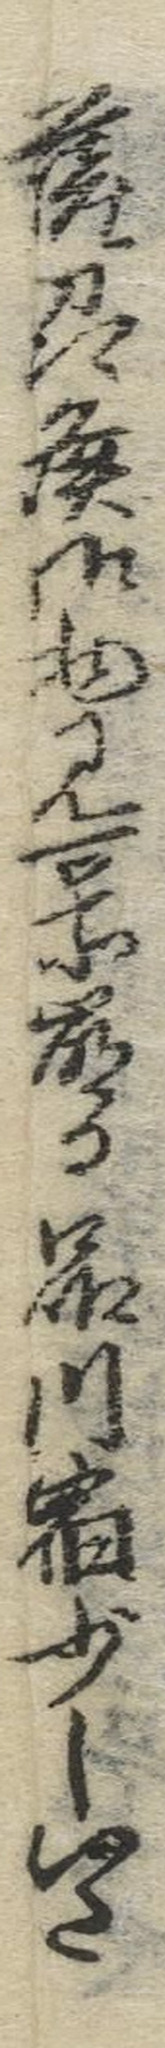薩州侯御物見一ツ所崩る品川宿少しいた
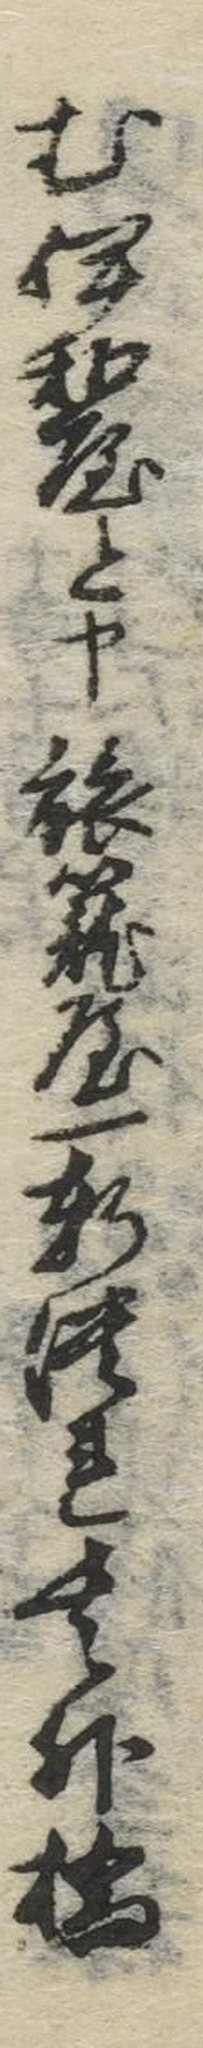む伊和屋と申旅籠屋一軒潰れ其外橋
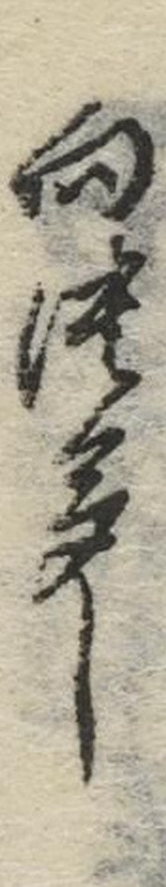向潰多し
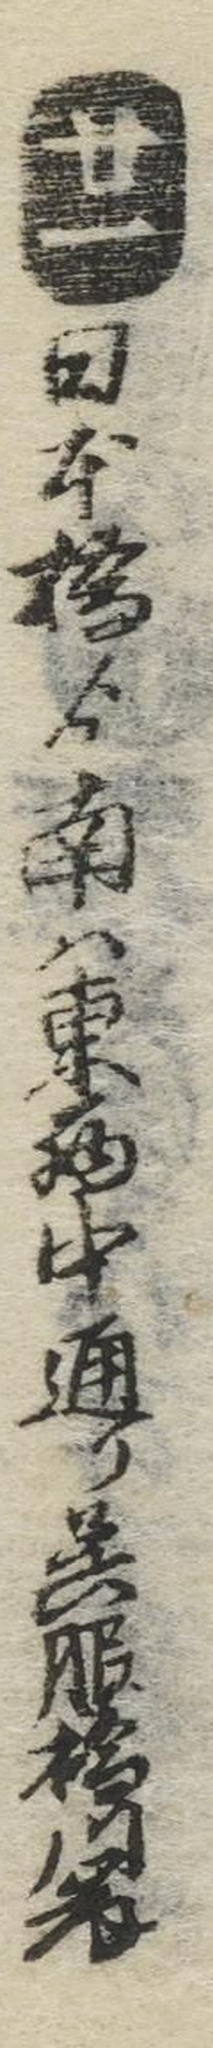廿一日本橋ゟ南ハ東西中通り呉服橋川岸
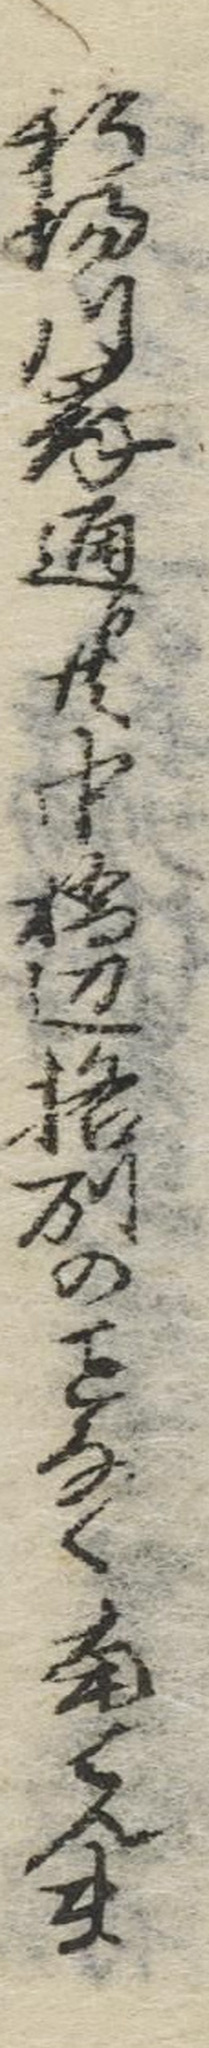新場川岸通り共中橋辺格別のことなく南てんま
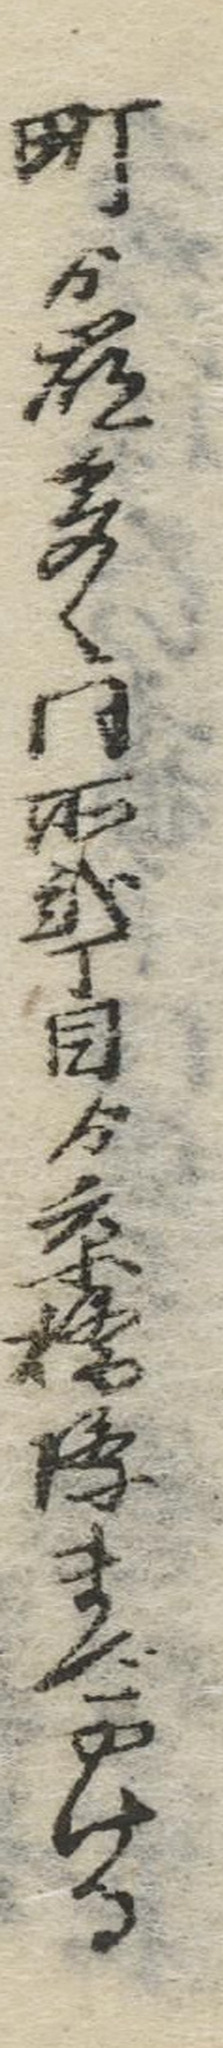町ゟ崩多く同所弐丁目ゟ京橋際までやける
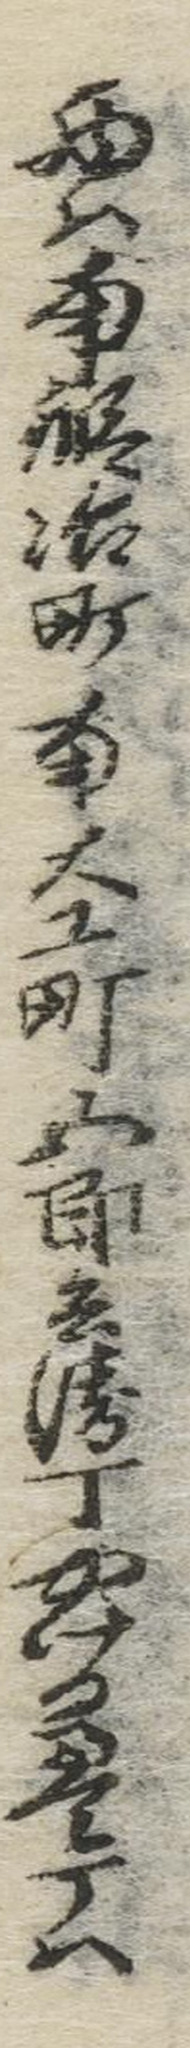西ハ南鍛冶町南大工町五郎兵衛丁やける畳丁ハ
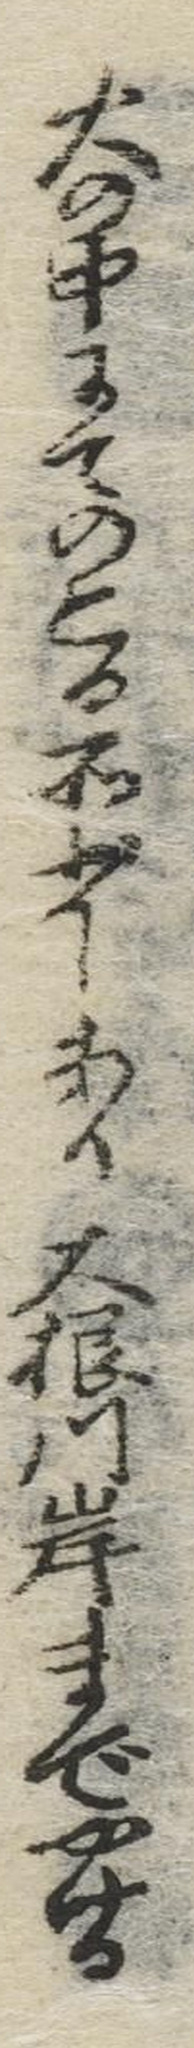火の中にてのこる所少しあり大根川岸までやける
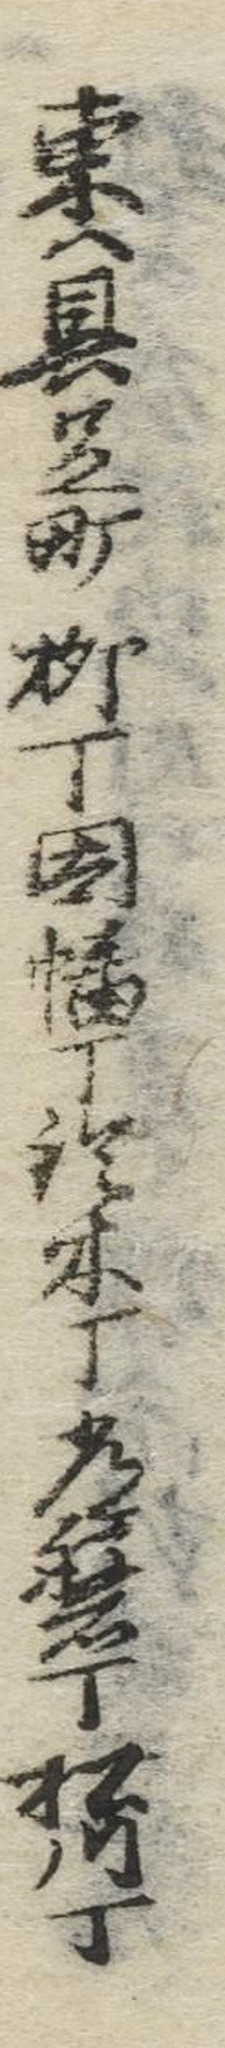東ハ具足町柳丁因幡丁鈴木丁常盤丁松川丁
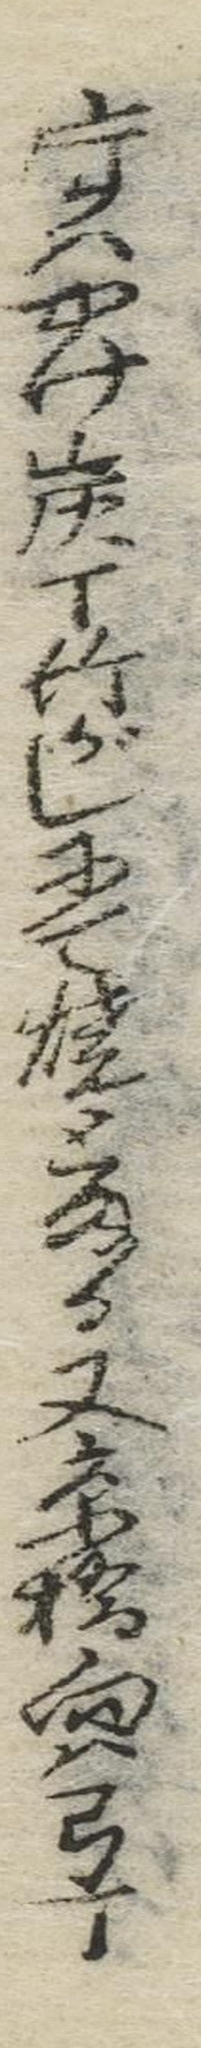片かハやけ炭丁竹がしにて焼とまる又京橋向ハ弓丁
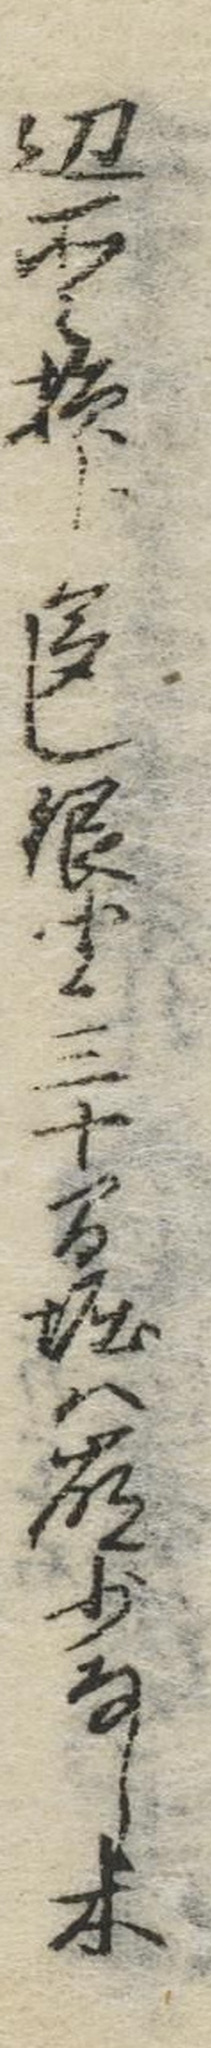辺所〻損じ多し銀坐三十間堀ハ崩少なし木
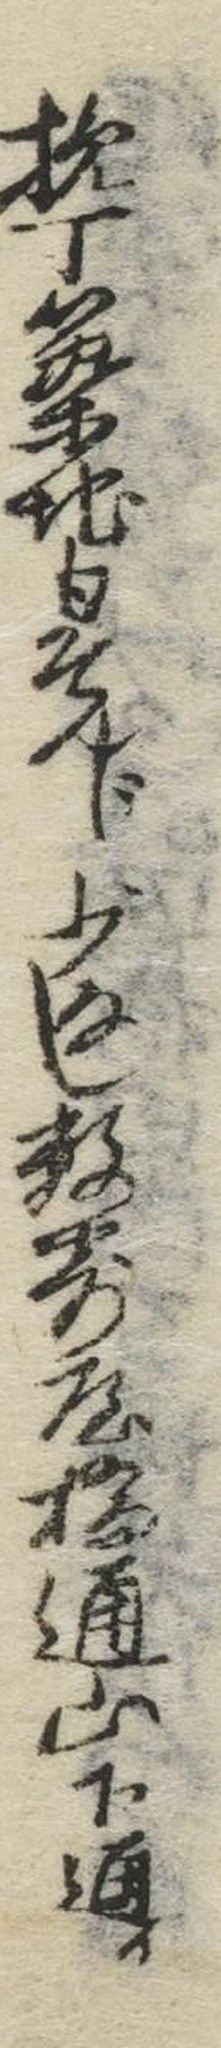挽丁築地もそんじ少なし数寄屋橋通山下通り

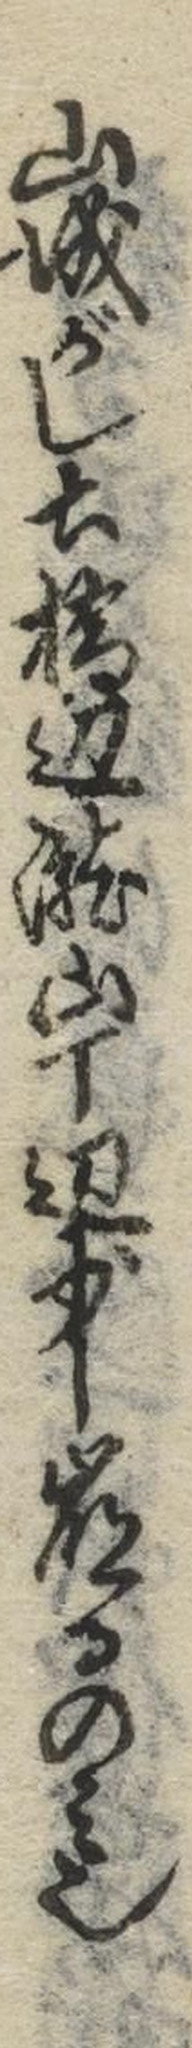山城がし土橋辺瀧山丁辺少し崩るのミ也
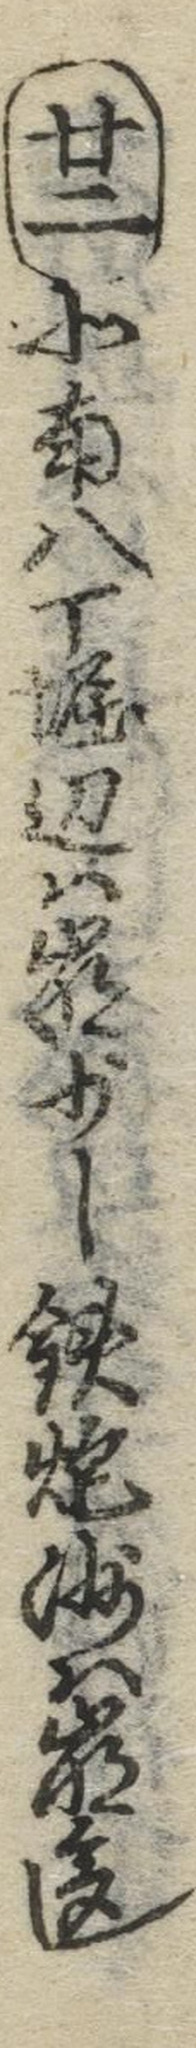廿二北南八丁堀辺ハ崩少し鉄砲洲ハ崩多し
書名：江戸御屋鋪方町方共　地震類焼場所巨細書之寫　潰家潰土蔵共取調附街道筋近在迄
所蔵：東京大学地震研究所図書室 Earthquake Research Institute Library, The University of Tokyo, JAPAN
